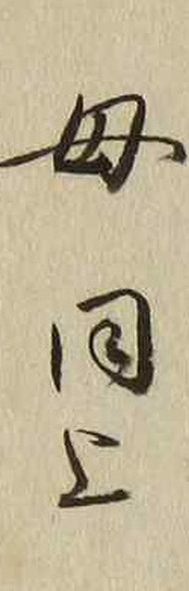母同上

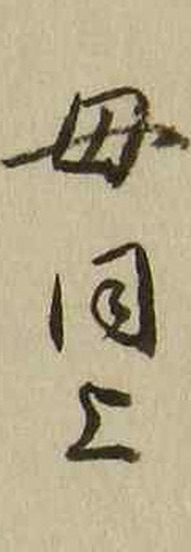母同上
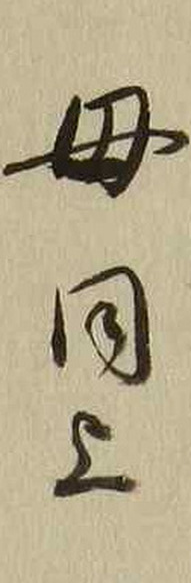母同上
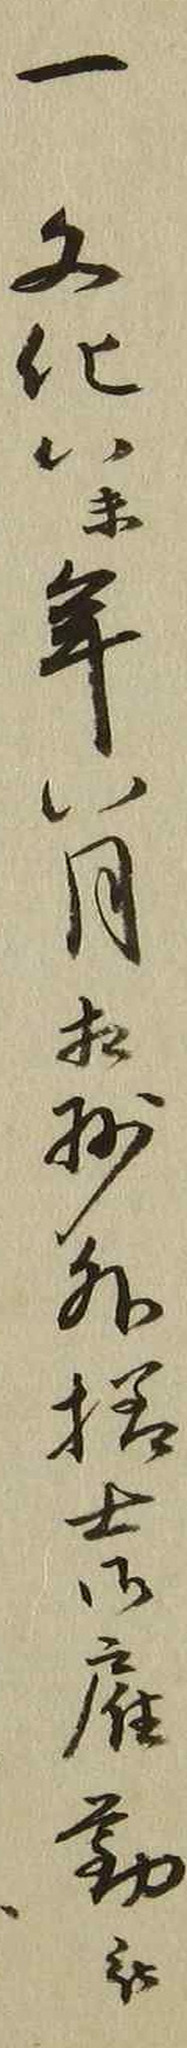一文化八未年八月相州外様士御雇勤被
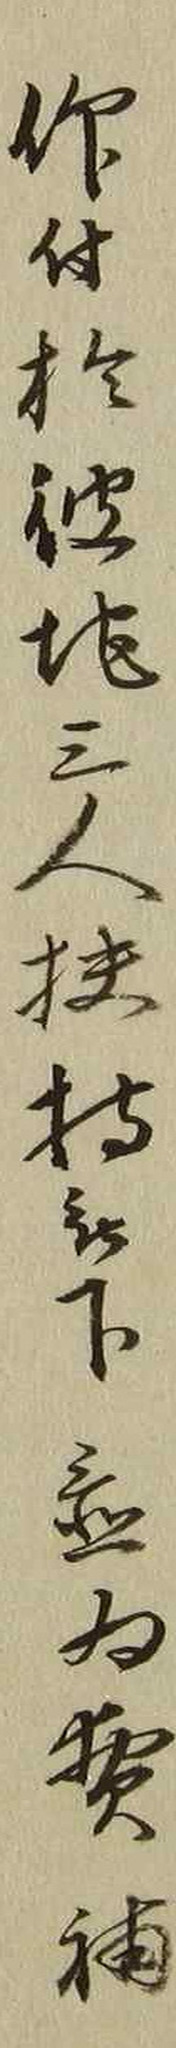仰付於彼地三人扶持被下置為費補
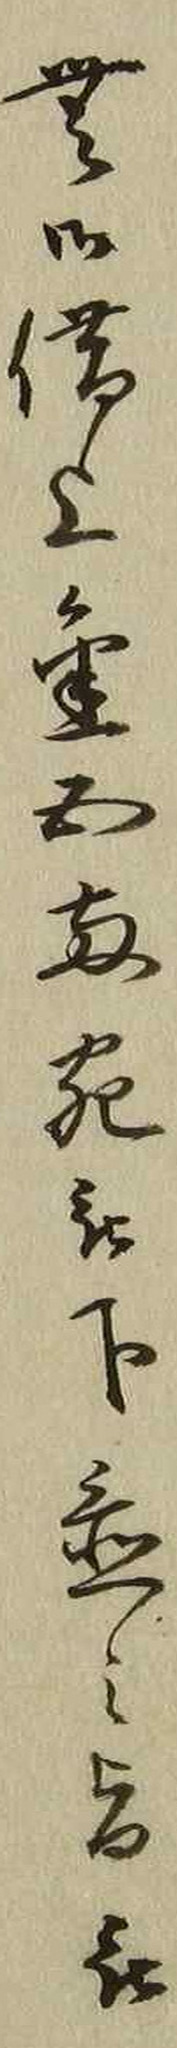無候借上金五両宛被下置之旨被
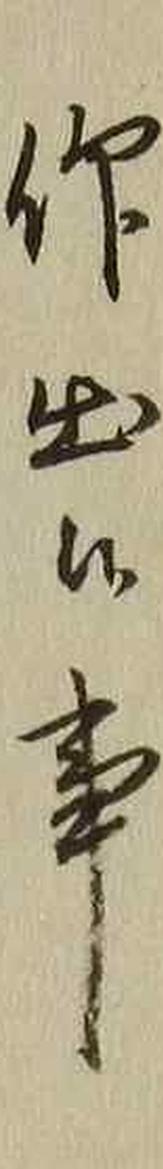仰出候事
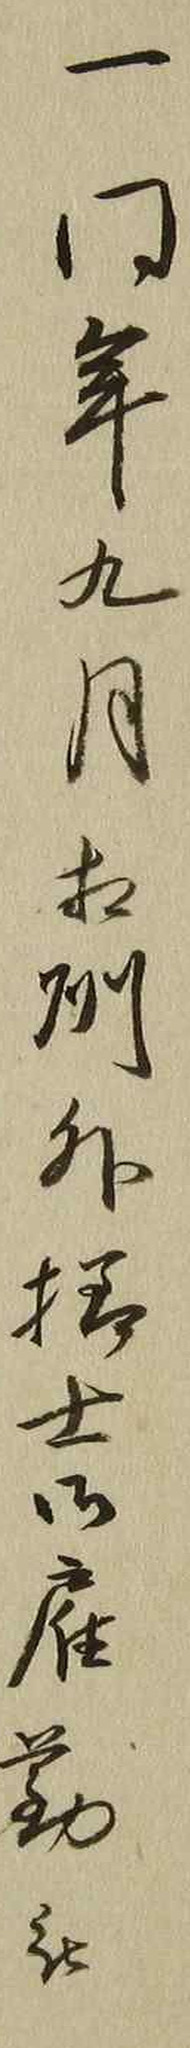一同年九月相州外様士御雇勤被
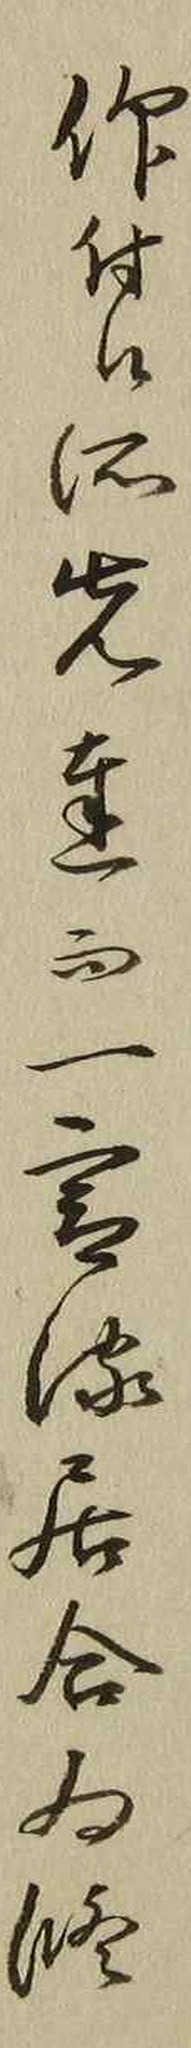仰付候所先達而一宮隊居合為修
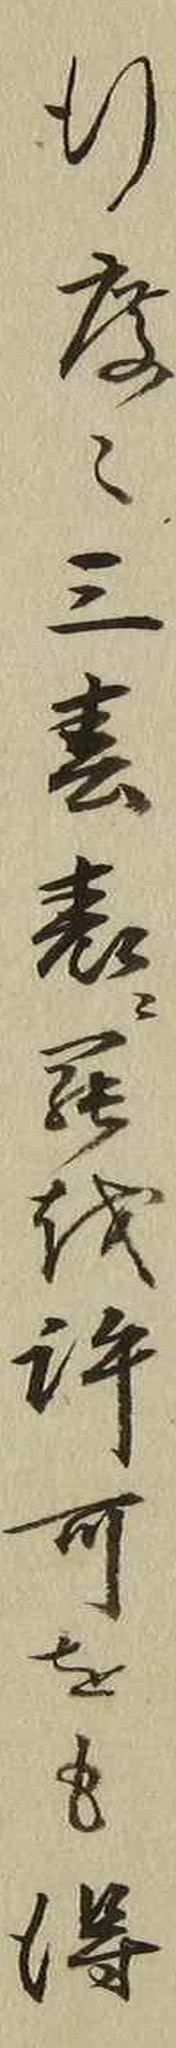行度々三春表ニ罷越許可をも得
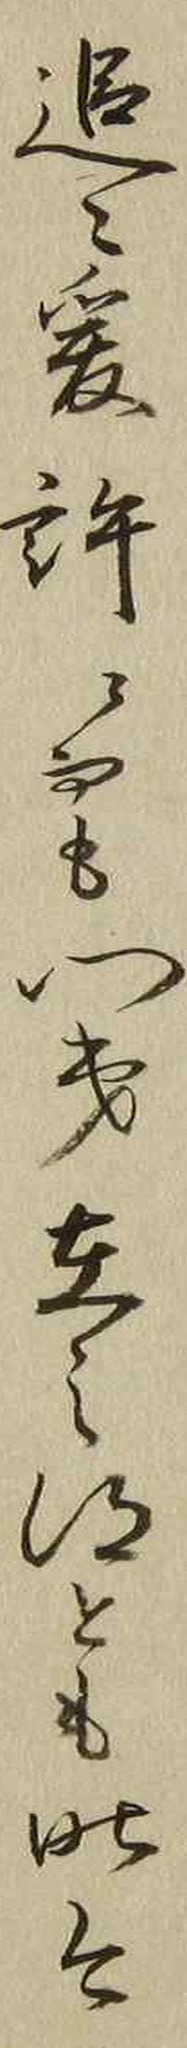追々爰許ニ而も門弟在之得とも昨今
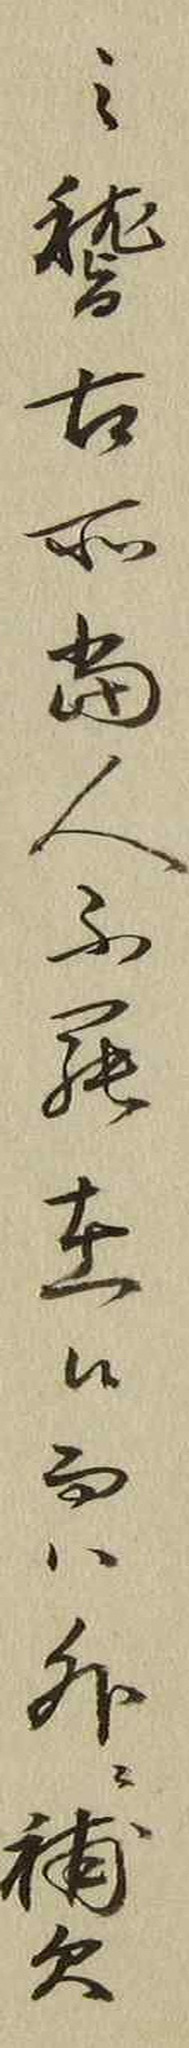之稽古所当人不罷在候而ハ外ニ補欠
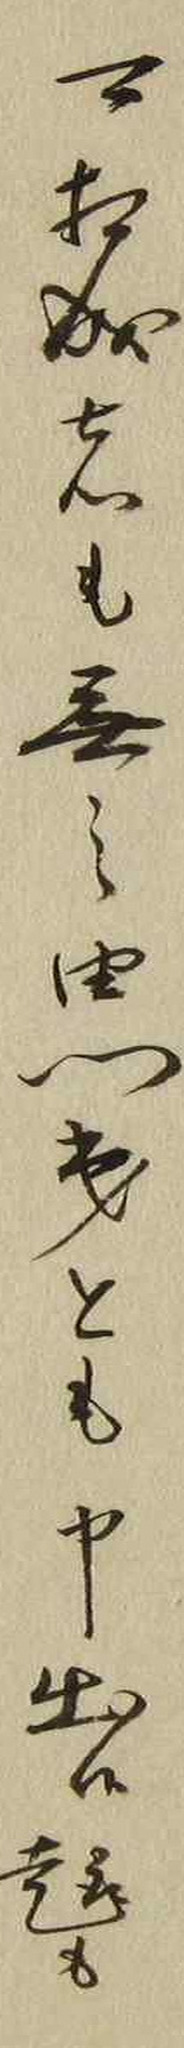可相成者も無之由門弟とも申出候趣も
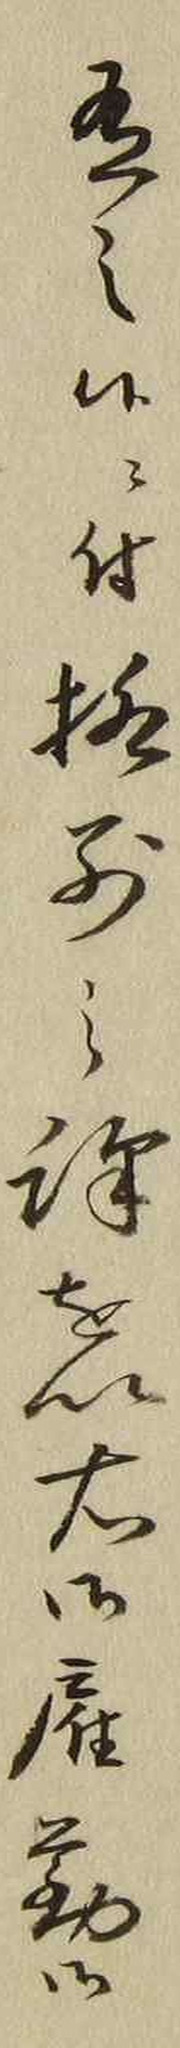有之候ニ付格別之訳を以右御雇勤御
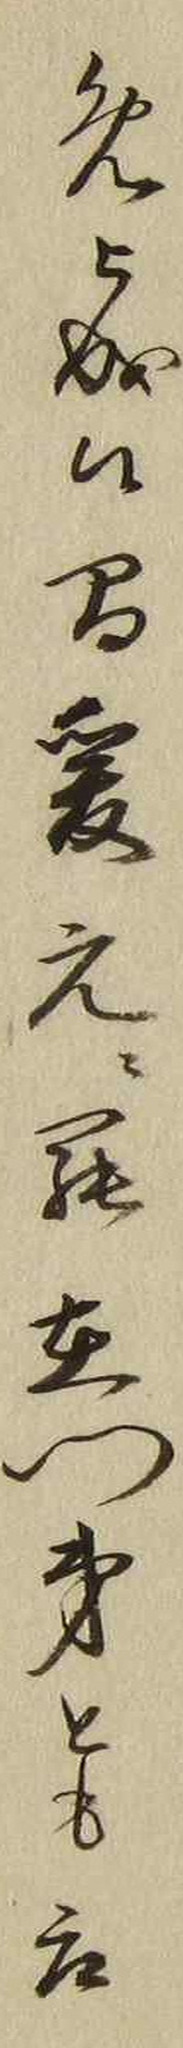免被成候間爰元ニ罷在門弟とも取
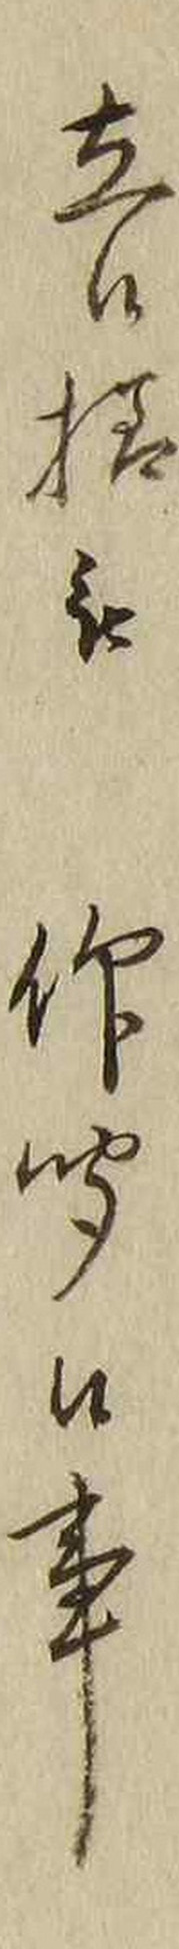立候様被仰聞候事
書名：諸士系譜　巻之128　た之部4
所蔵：会津若松市立会津図書館
